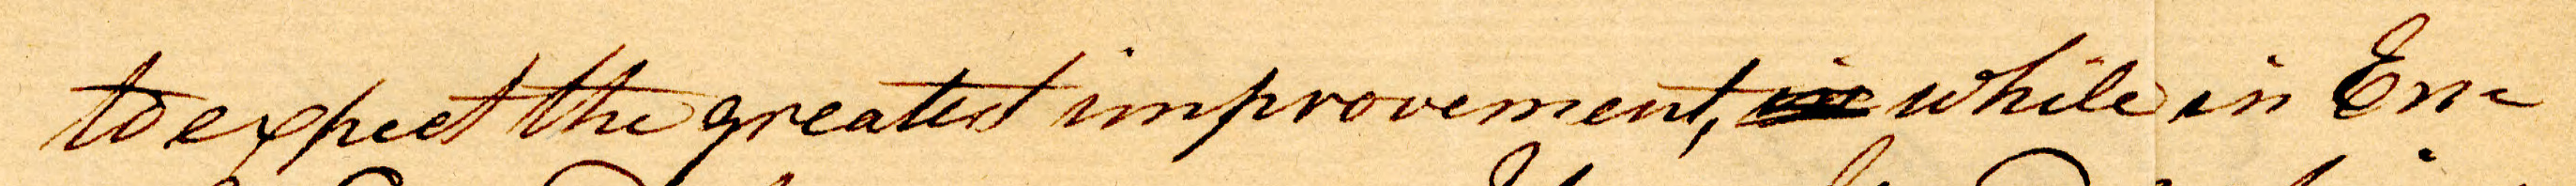to expect the greatest improvement, while in En-
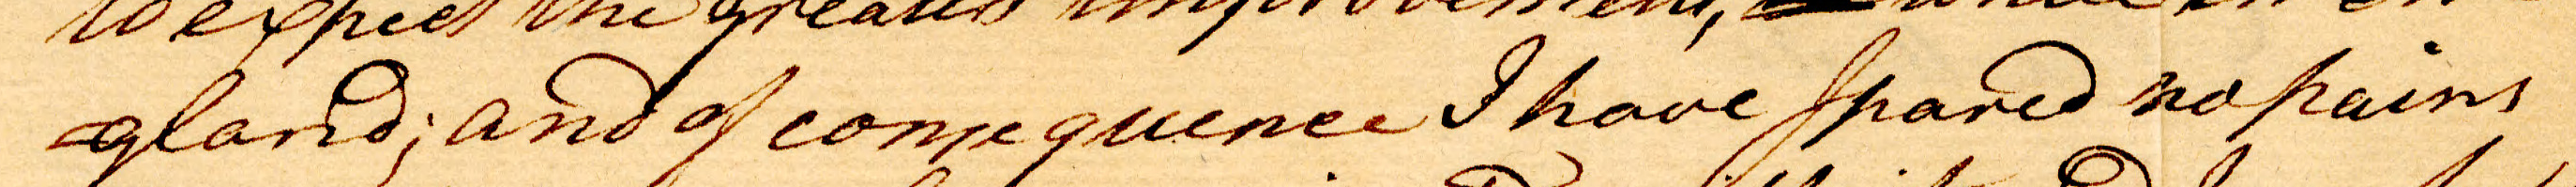-gland; and of consequence I have spared no pains
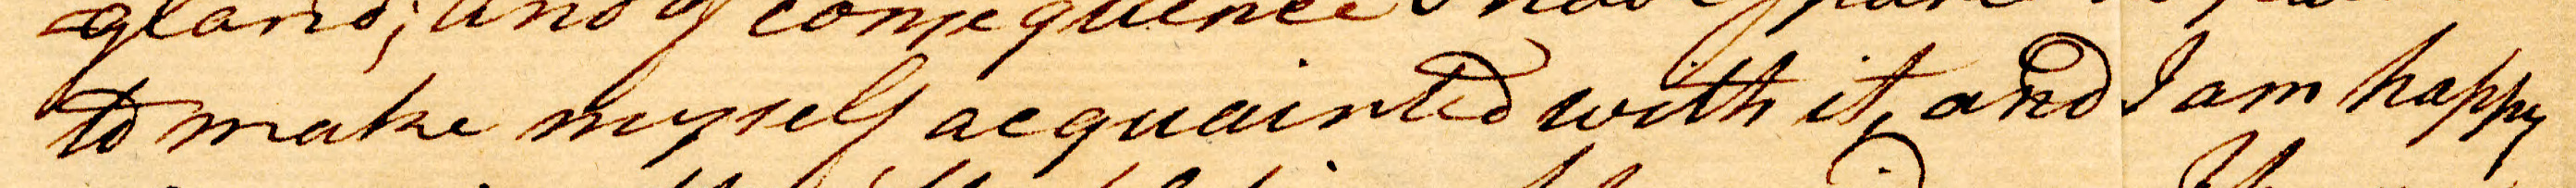to make myself acquainted with it, and I am happy
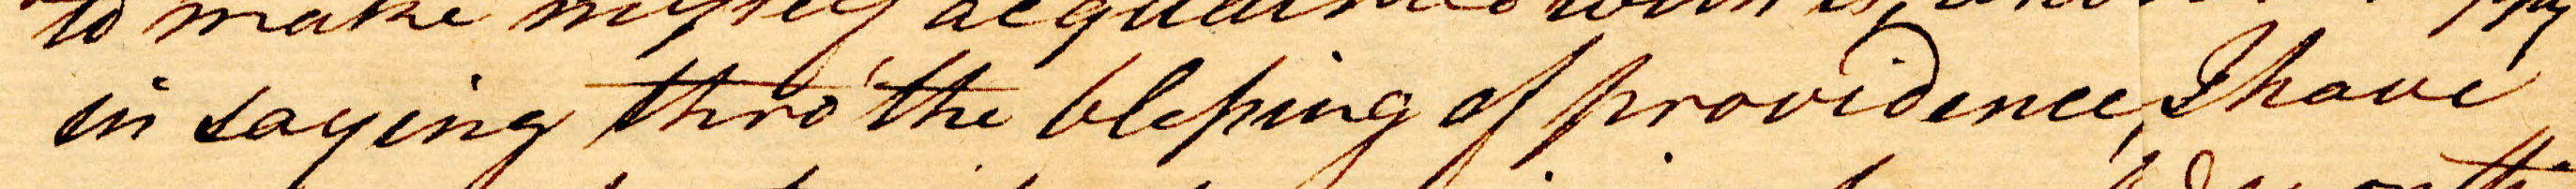in saying thro' the blessing of providence, I have
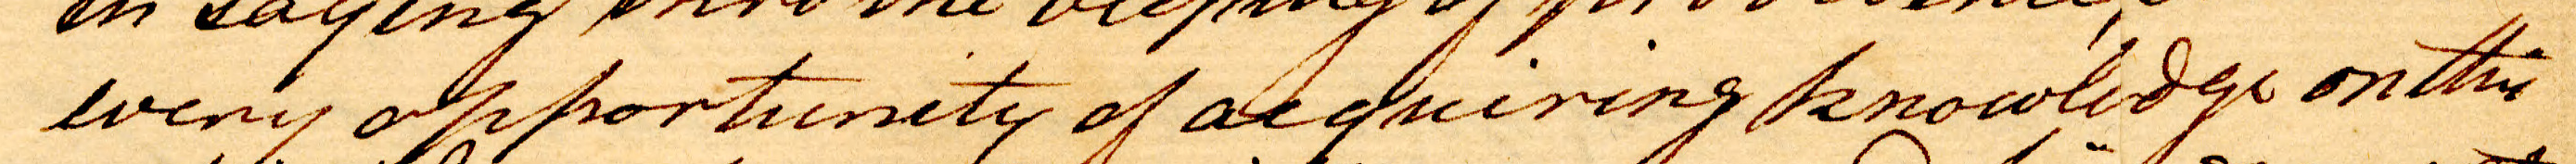every opportunity of acquiring knowledge on this
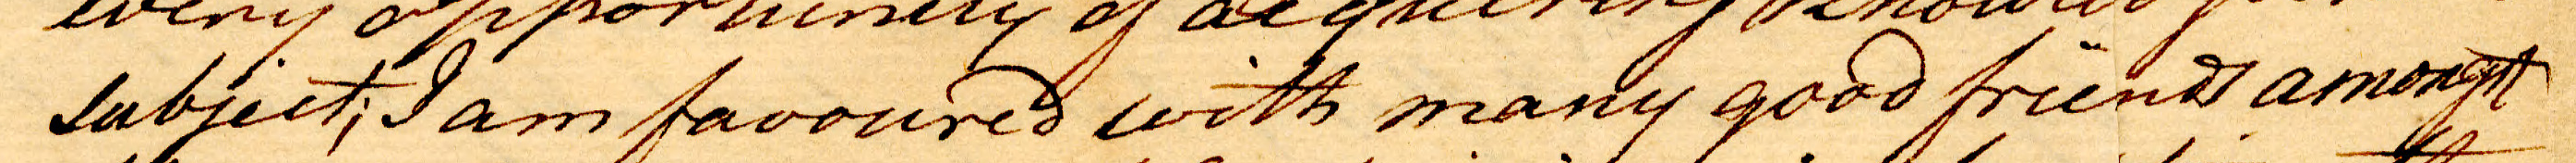subject; I am favoured with many good friends amongst
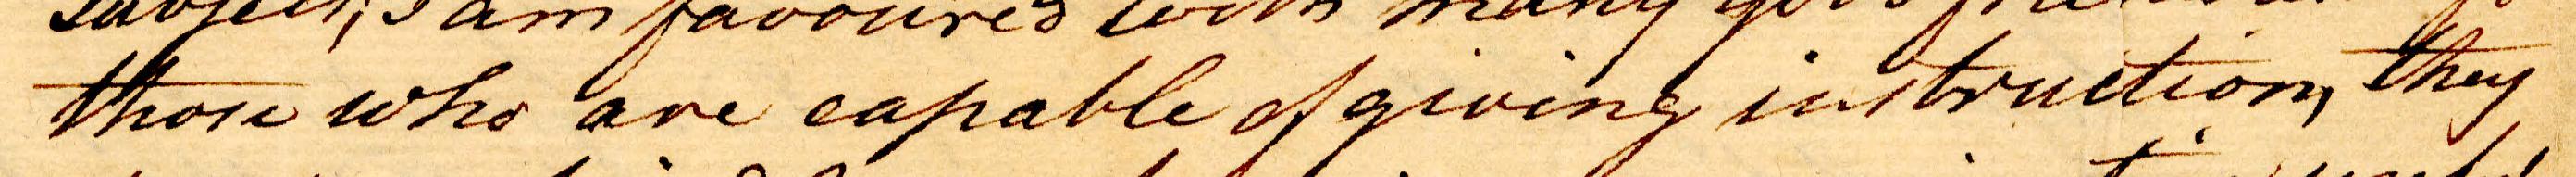those who are capable of giving instruction, they
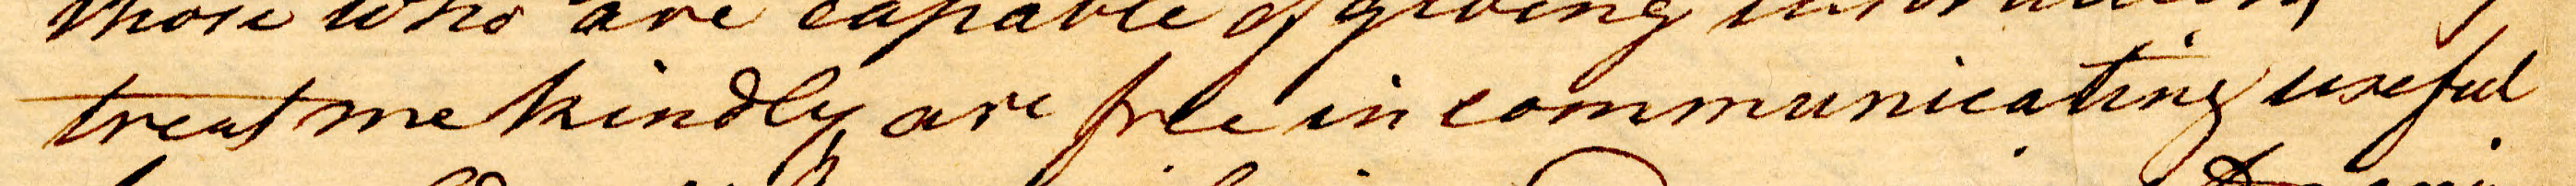treat me kindly, are free in communicating useful
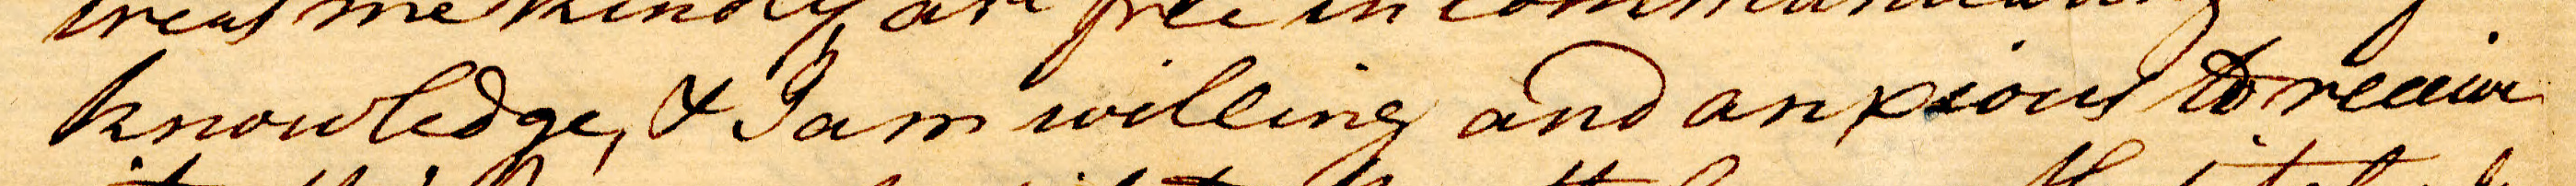knowledge, & I am willing and anxious to receive
